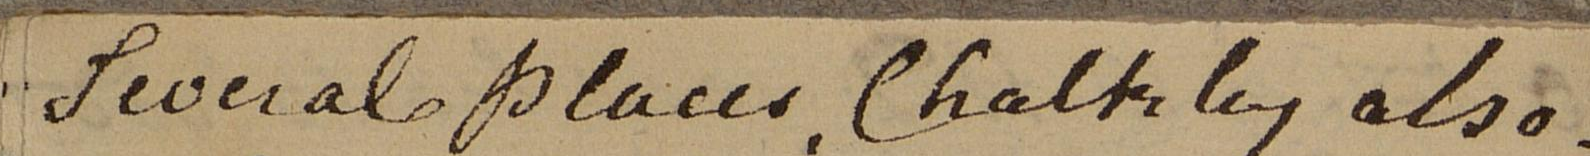Several places, Chalkley also
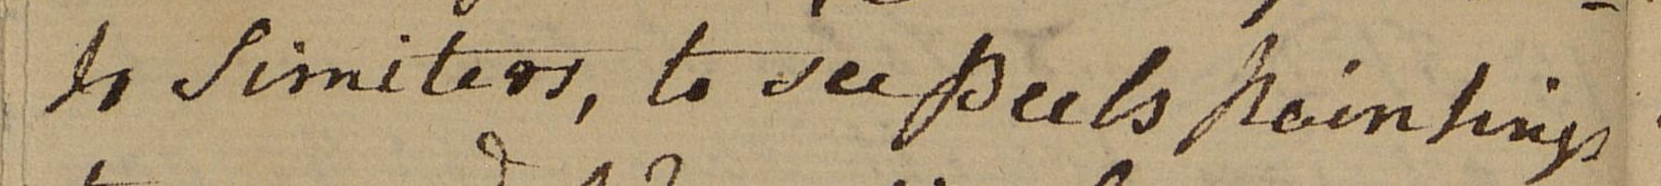to Simiters, to see Peels Paintings
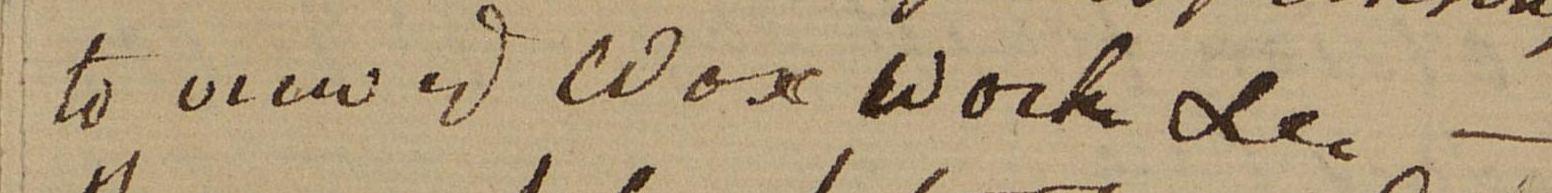to view y^e Wox Work &c--
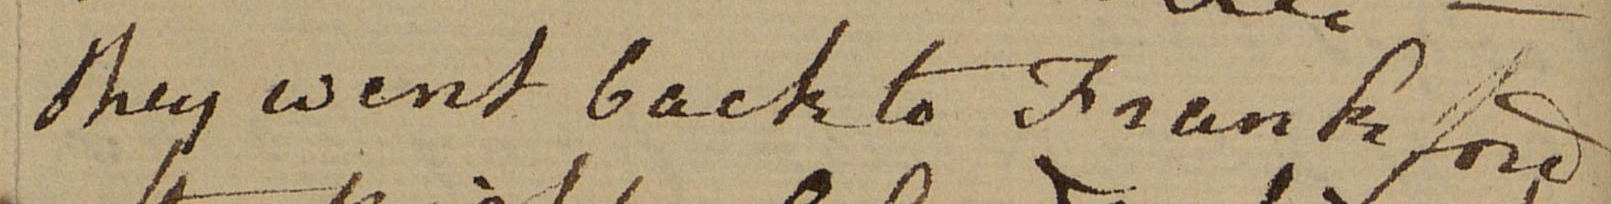they went back to Frankford
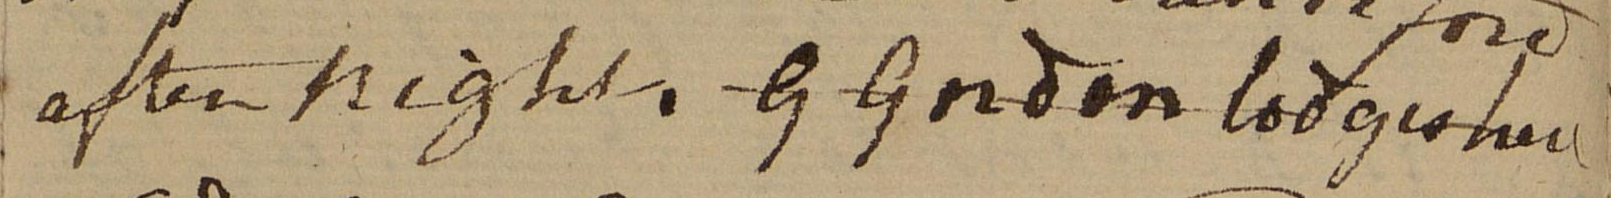after Night. G Gordon lodges here
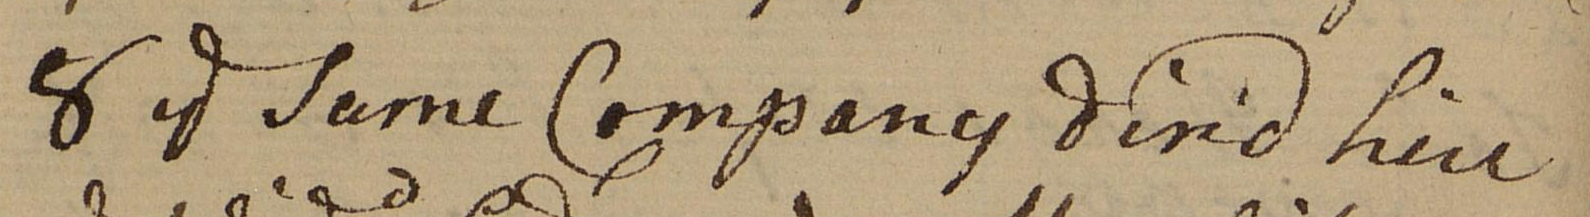8 y^e Same Company din'd hire
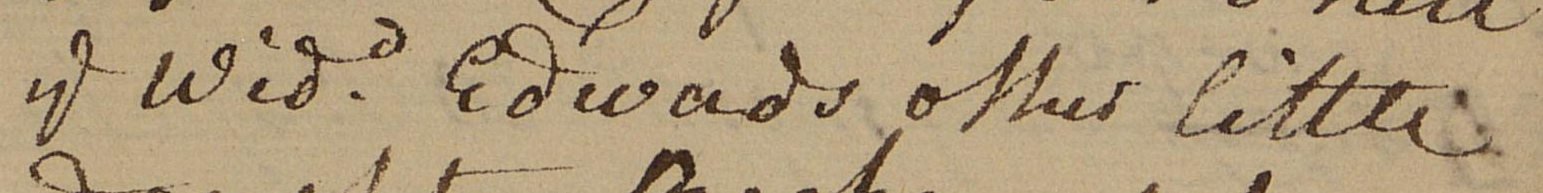y^e Wid^d. Edwads other little
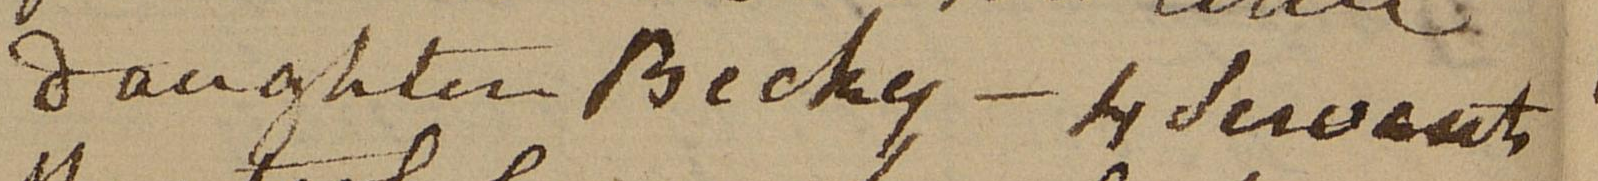daughter Becky- 4 Servant
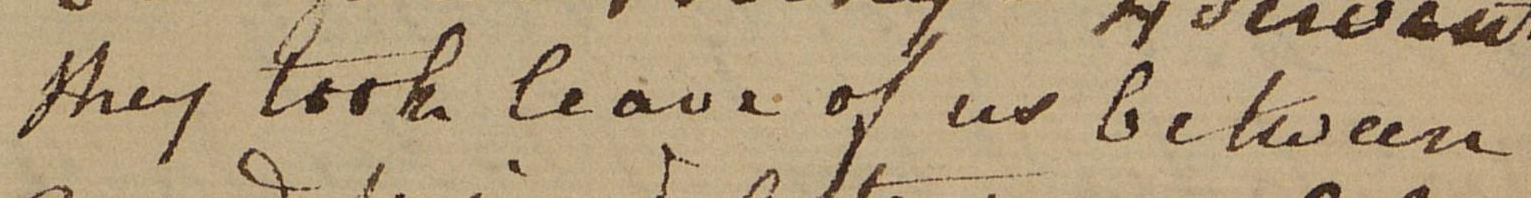they took leave of us between
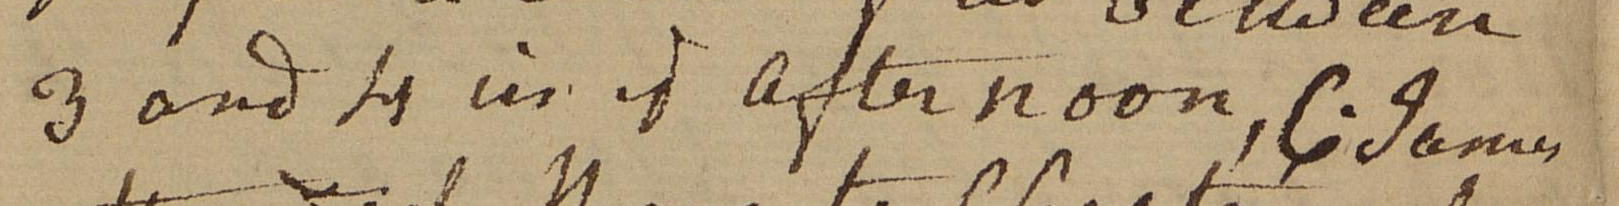3 and 4 in y^e after noon, C. Jamy
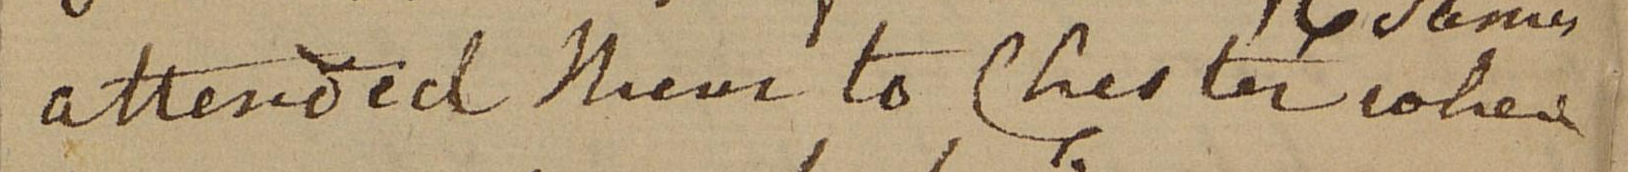attended [theur] to Chester whe[re]
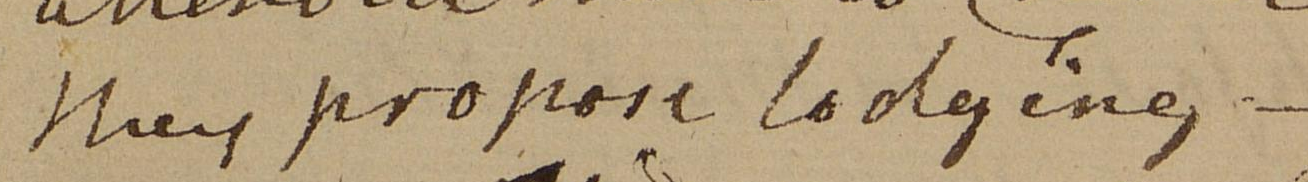they propose lodging-
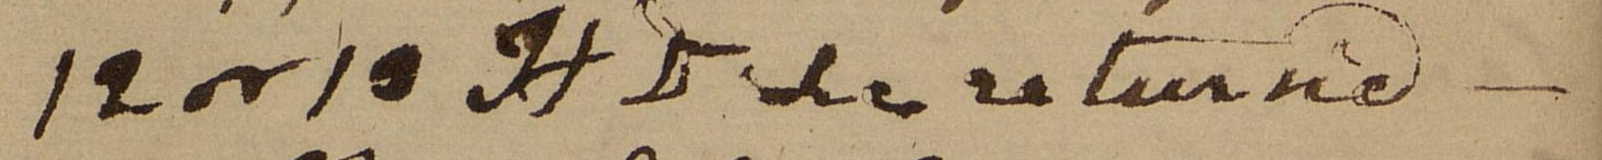12 or 10 HD &c return'd-
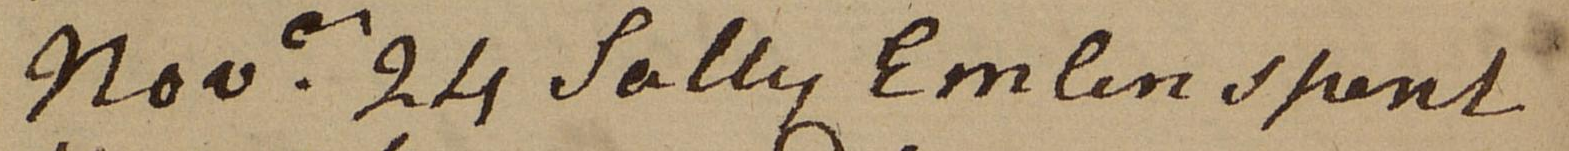Nov^r. 24 Sally Emlen spent
